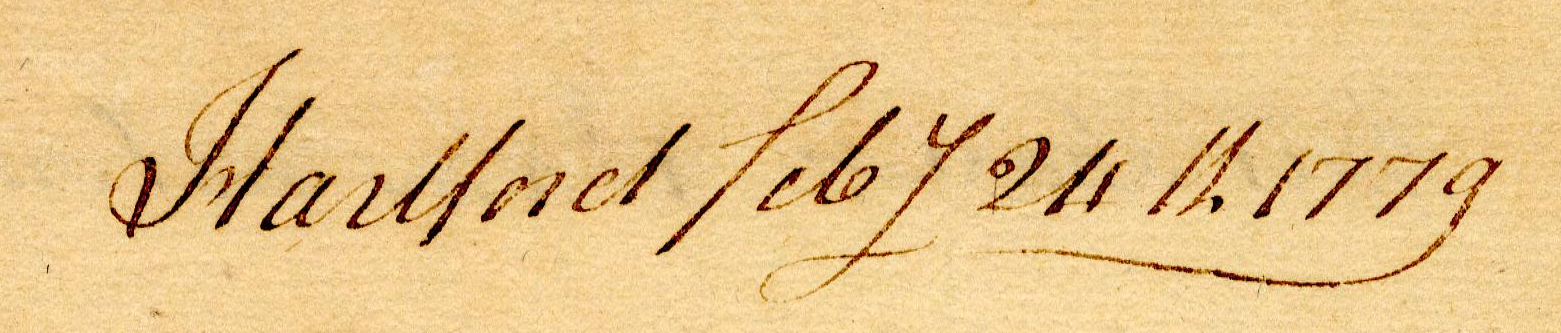Hartford feb^y 24th 1779
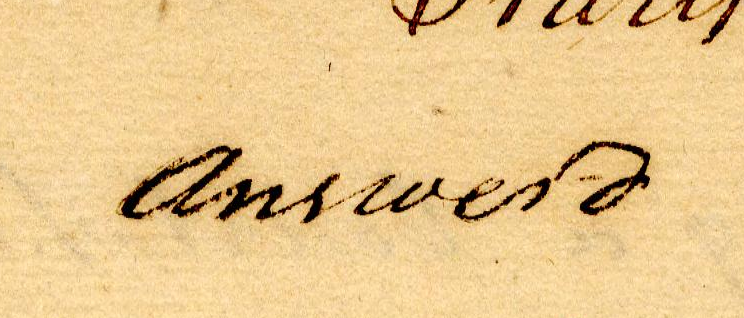Answer'd
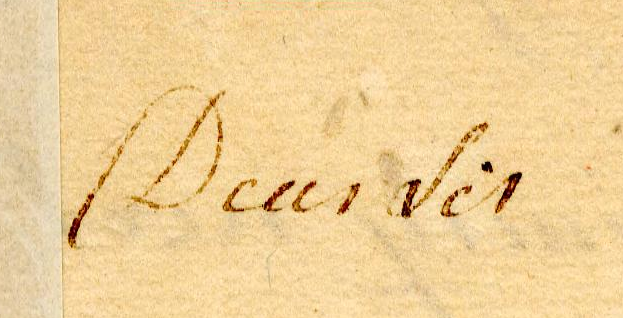Dear Sir
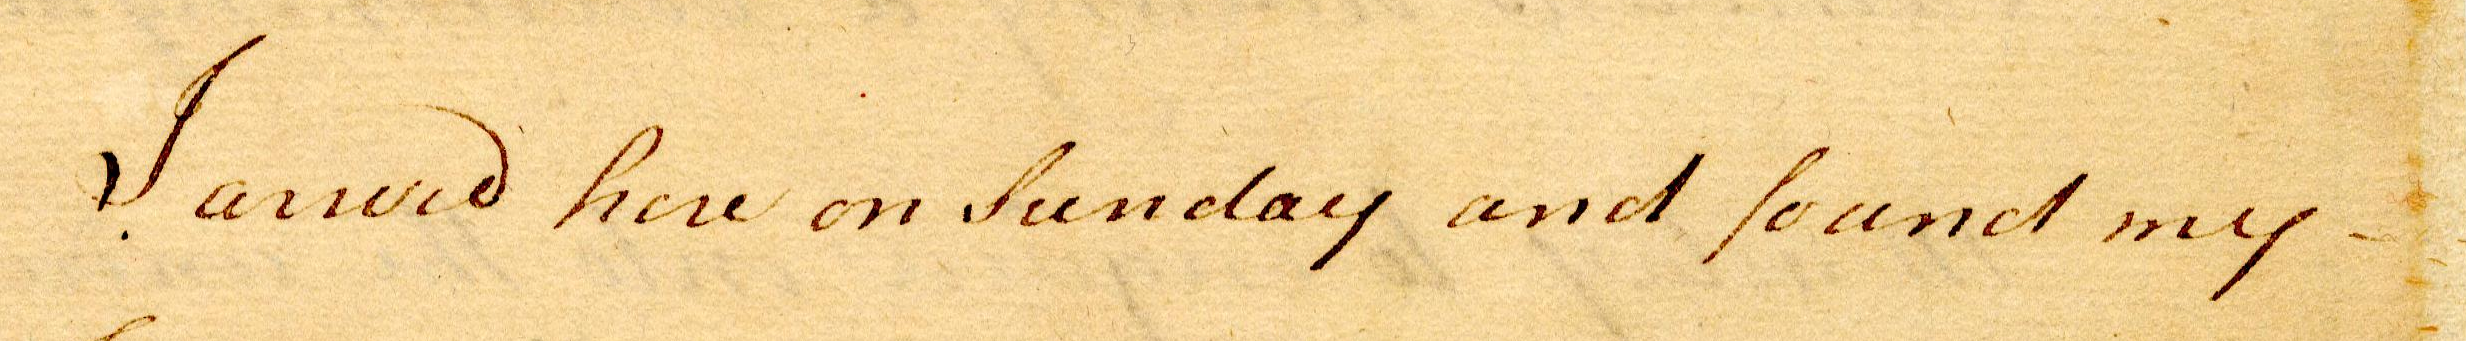I arrivd here on Sunday and found my
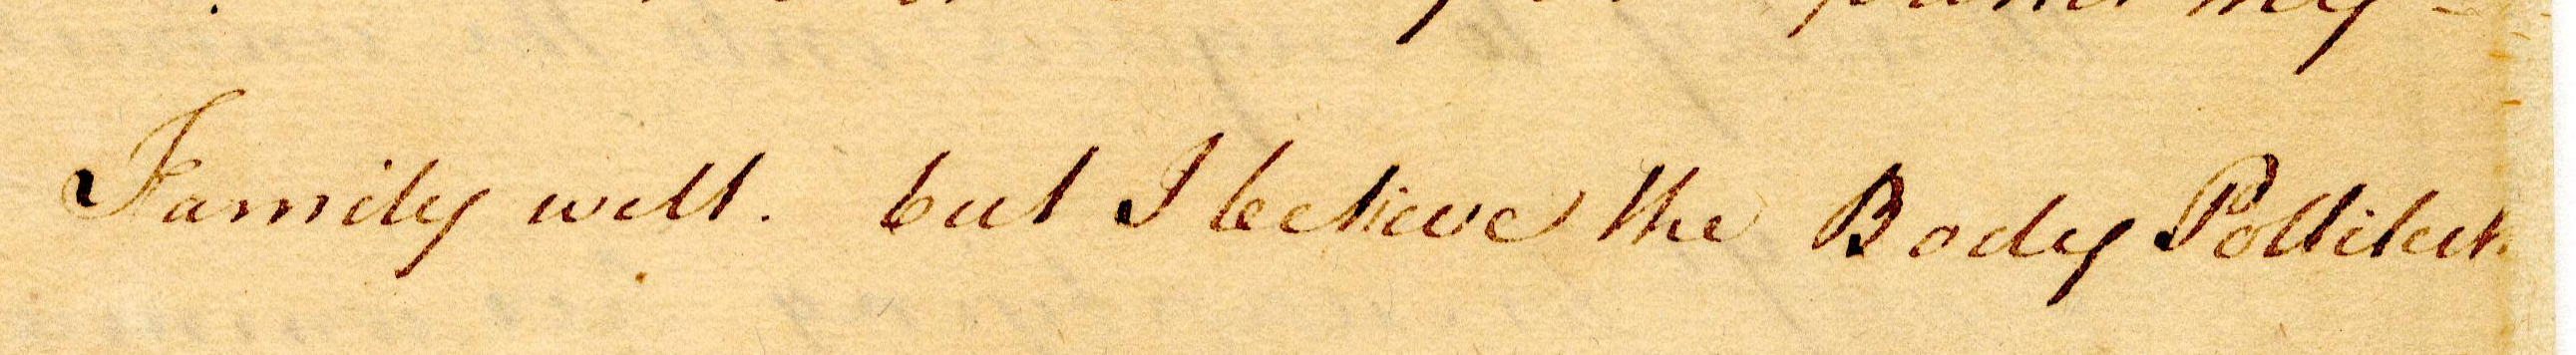Family well. but I believe the Body Pollitick
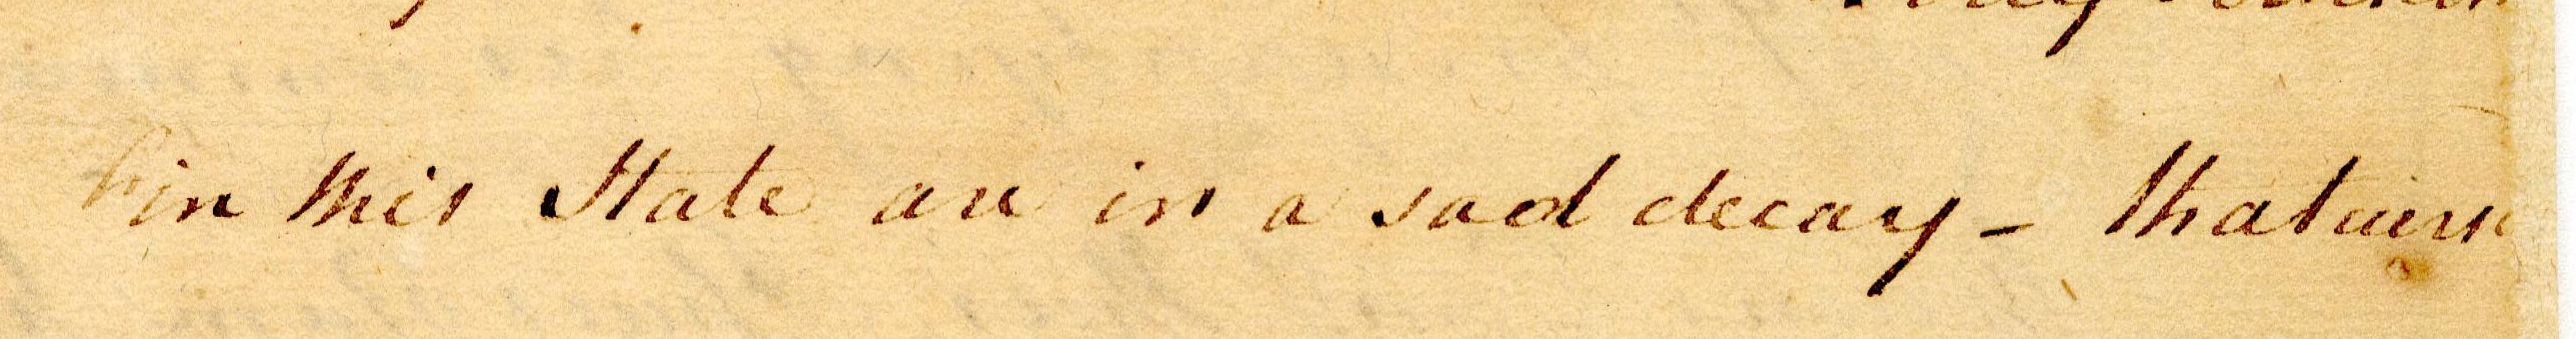in this State are in a sad decay- that aired
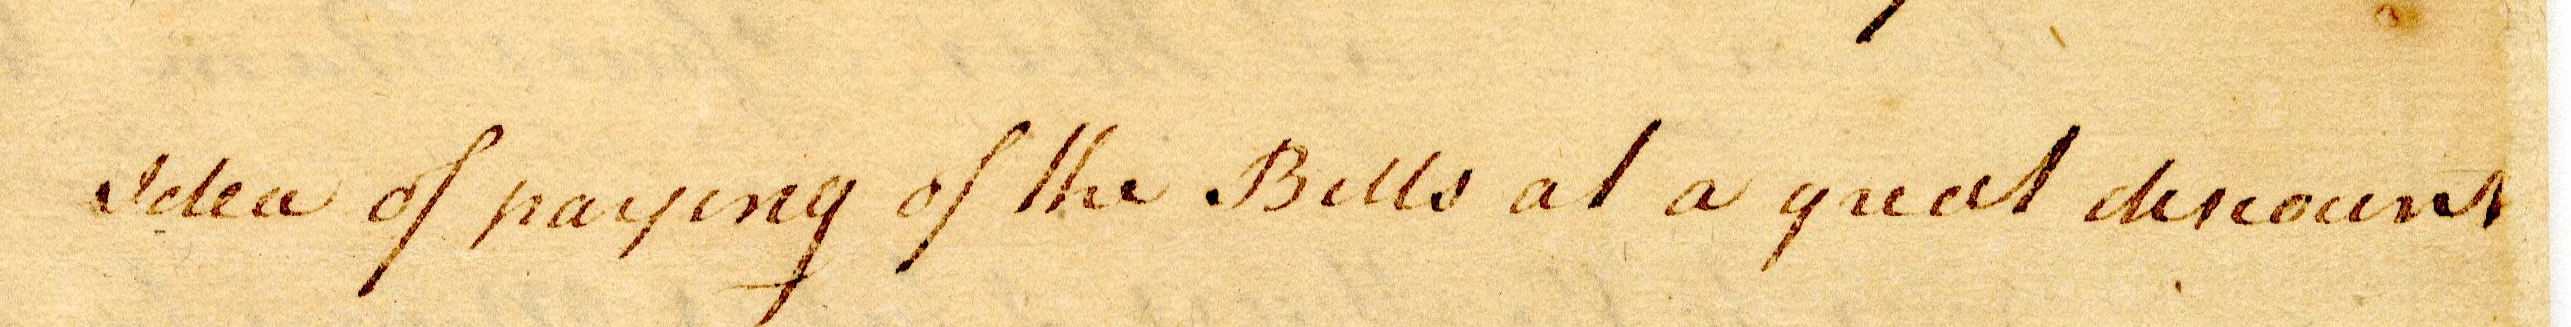Idea of paying of the Bills at a great discount
